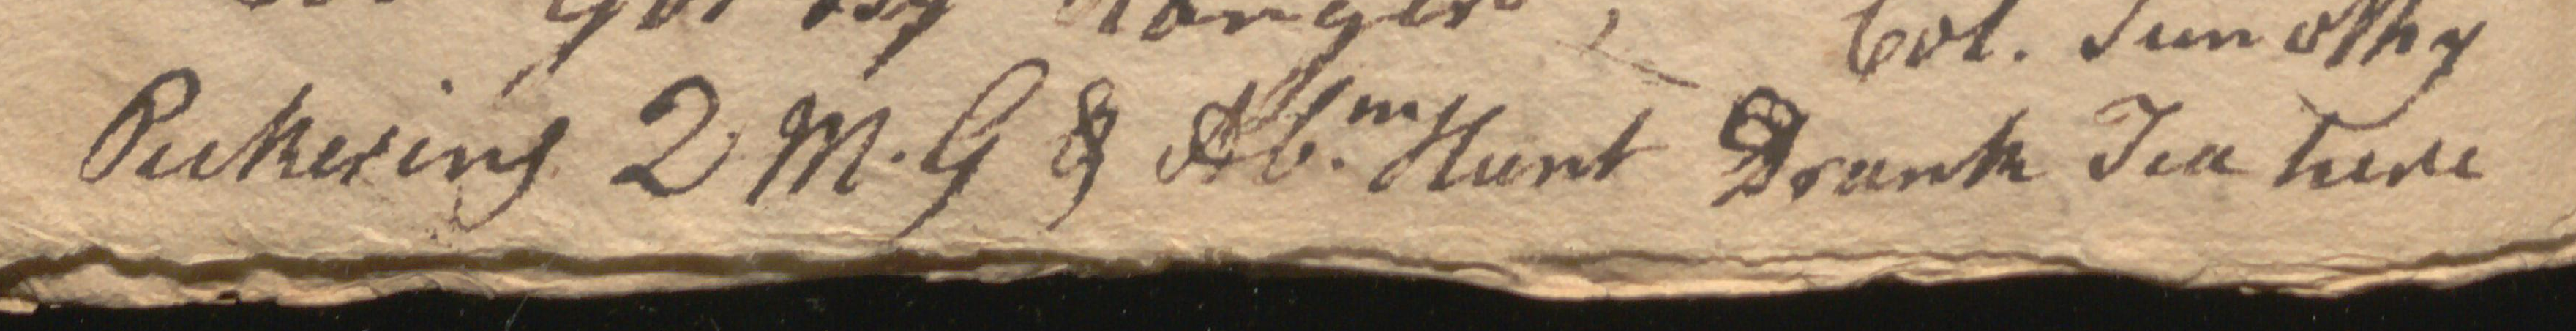Pickering QM.G & Ab^m. Hunt Drank Tea here
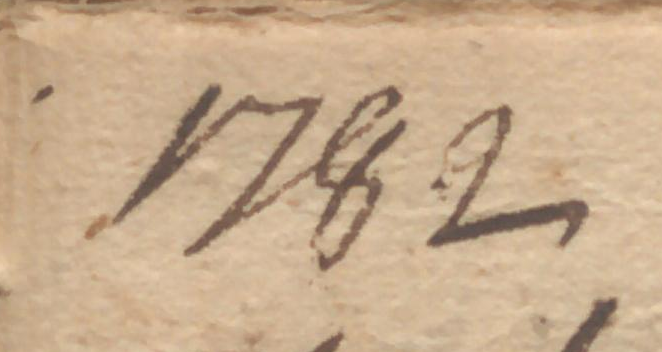1782
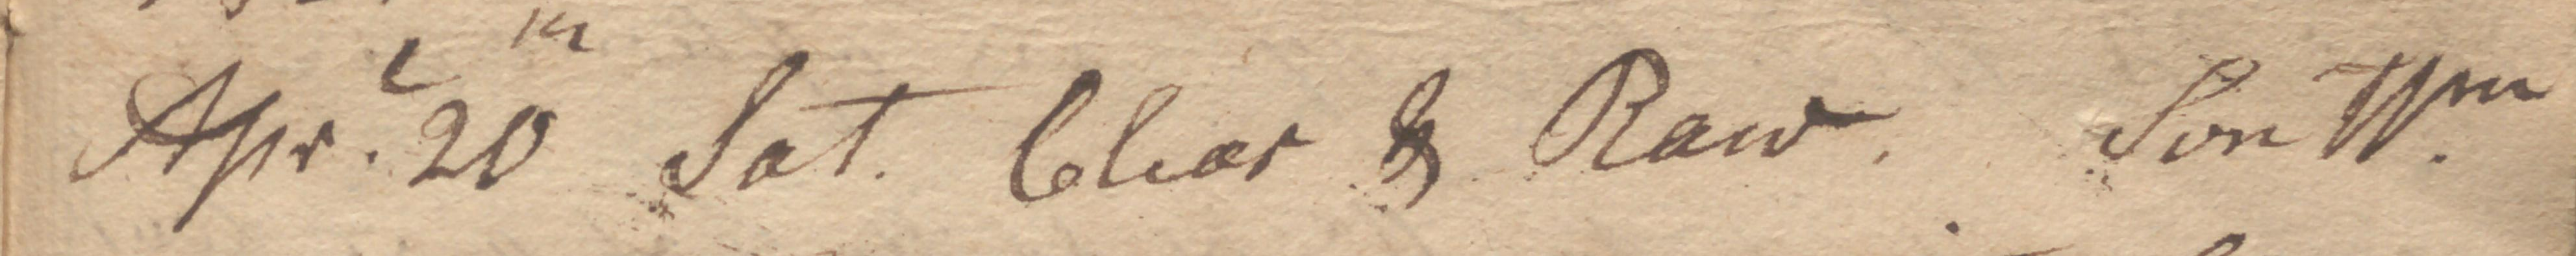Apr^l. 20^th Sat. Clear & Raw. Son W^m.
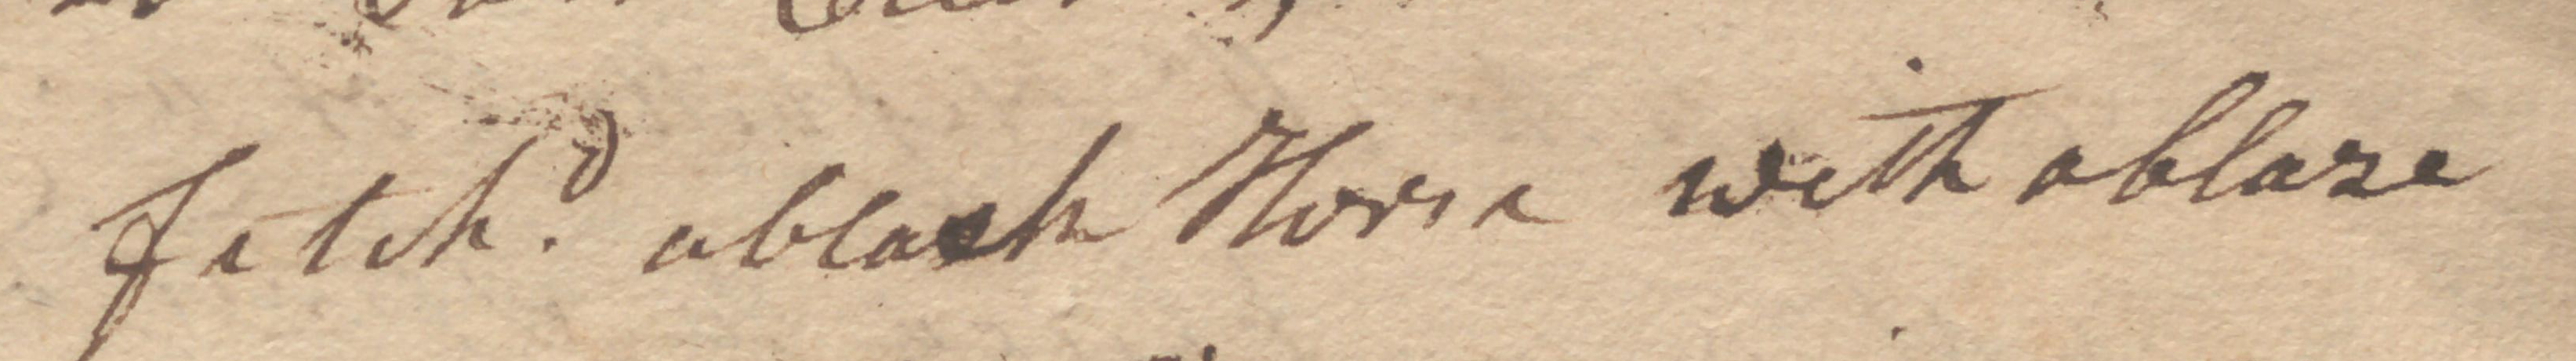fetch^d. a black Horse with a blaze
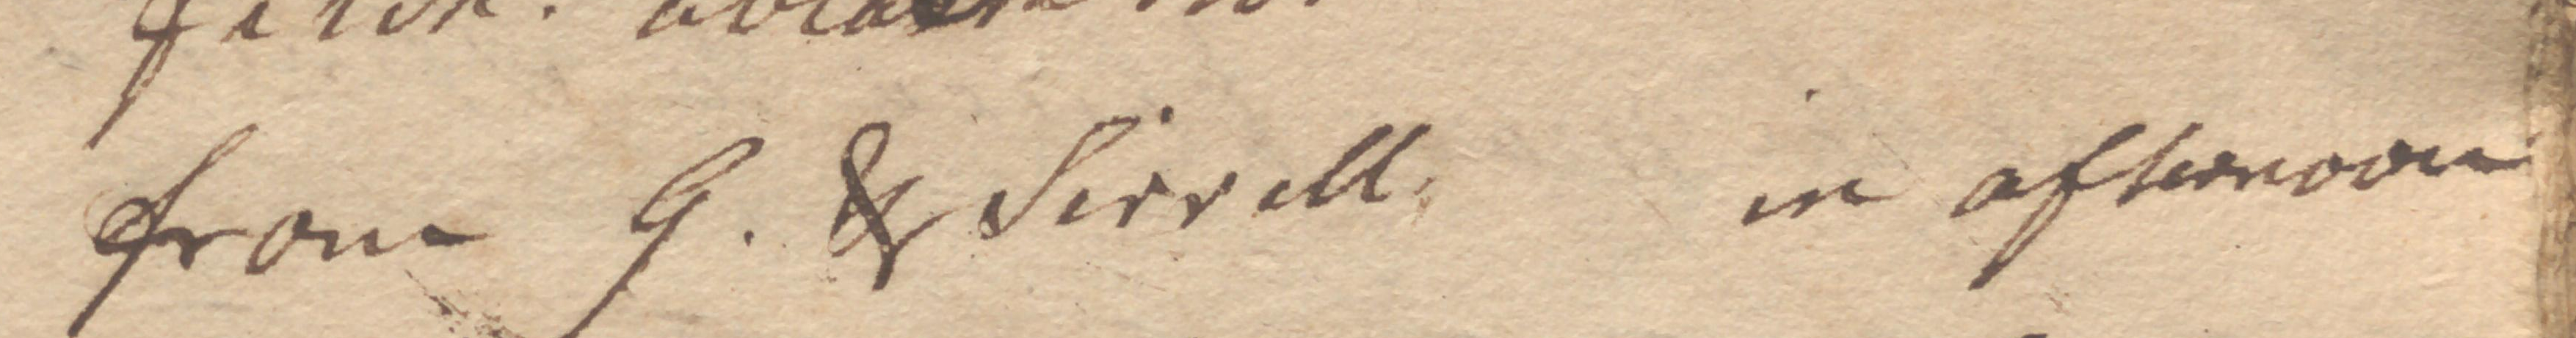from G. & Sirrell, in afternoon
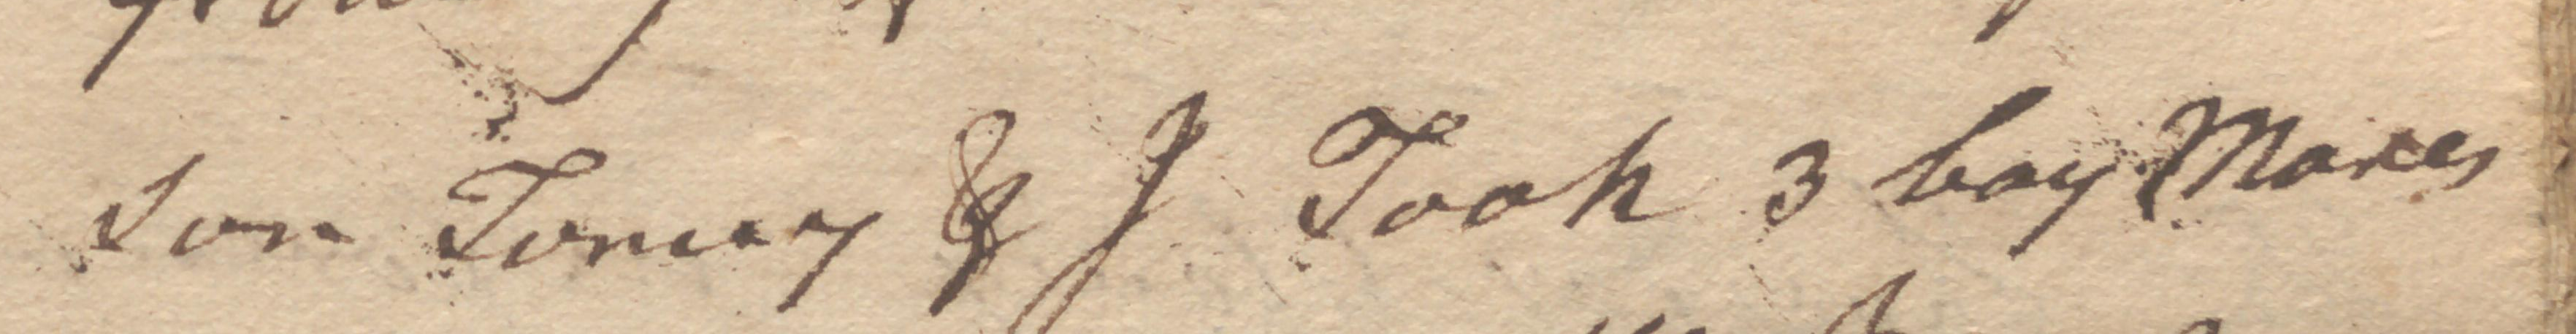Son Tomey & I Took 3 bay Mares
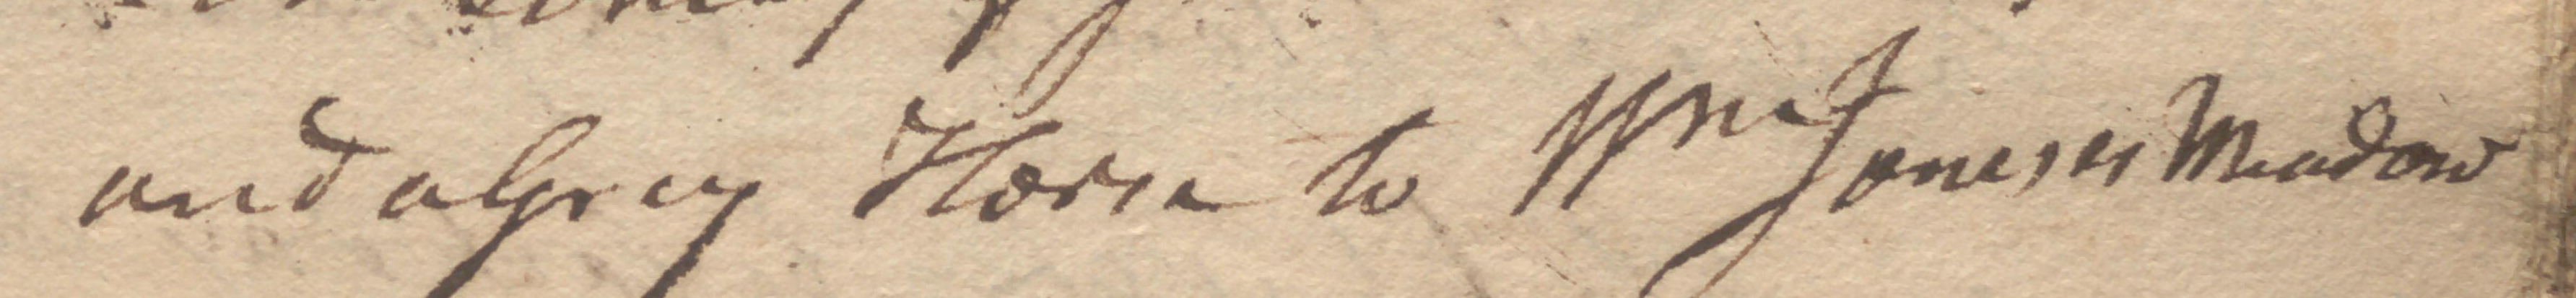and a Grey Horse to W^m. Joneses Meadow
